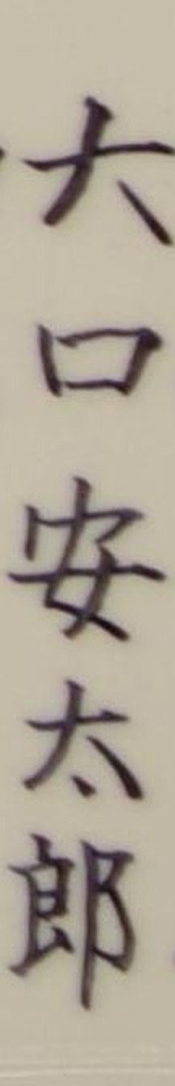大口安太郎
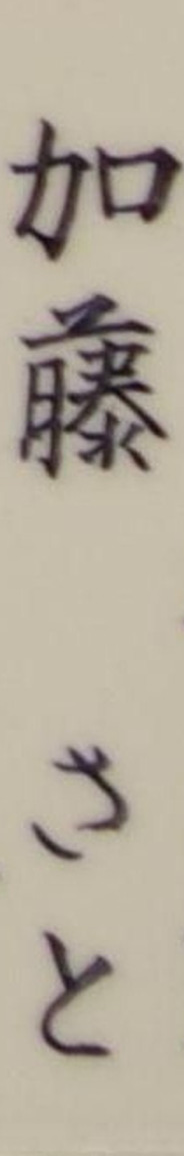加藤さと
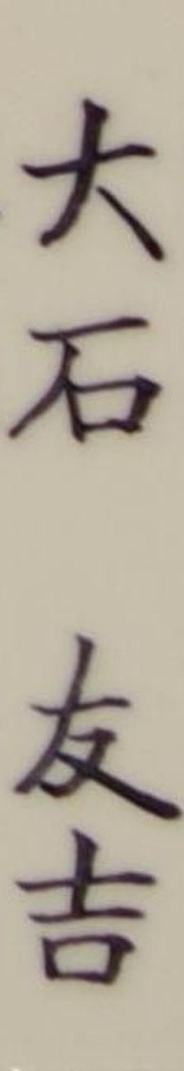大石友吉
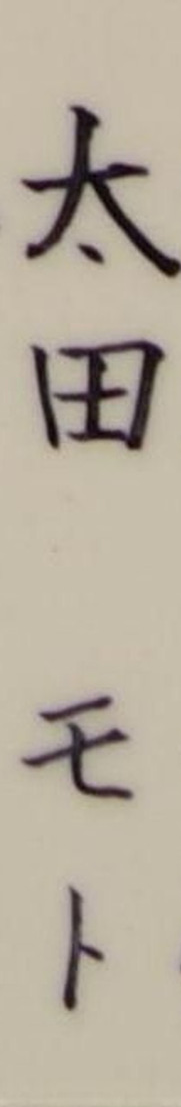太田モト
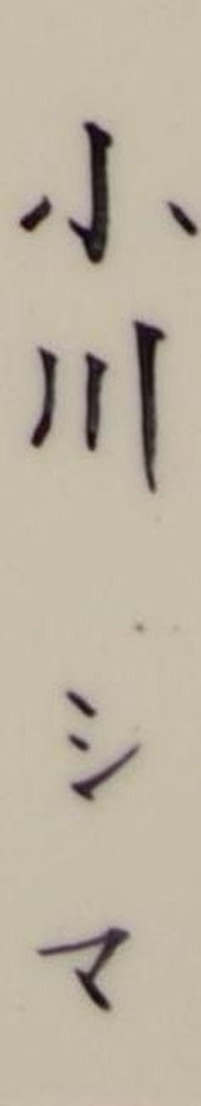小川シマ
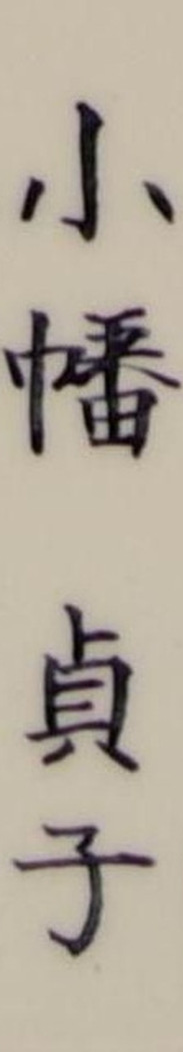小幡貞子
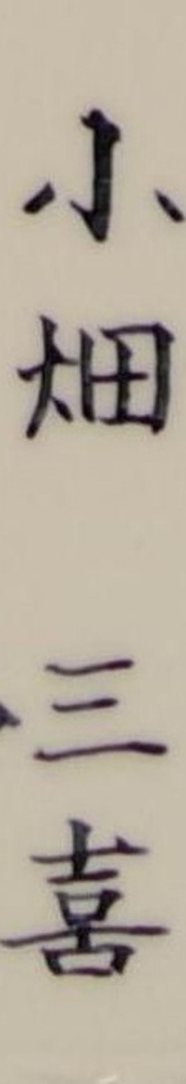小畑三喜
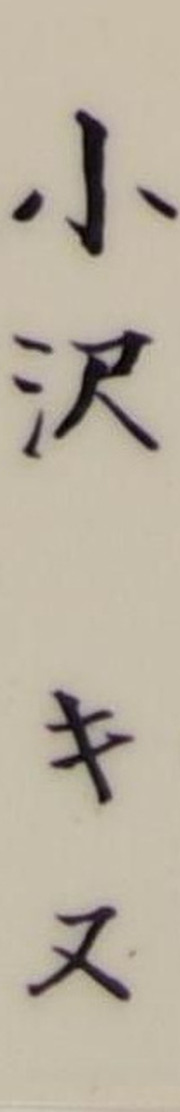小沢キヌ
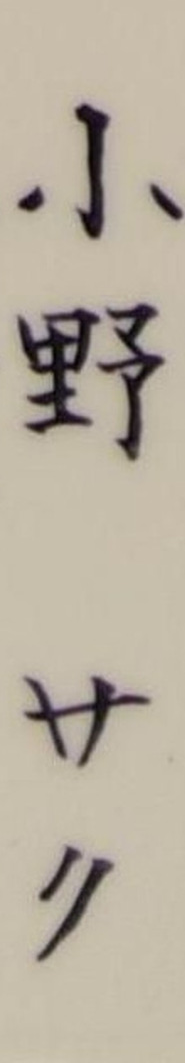小野サク
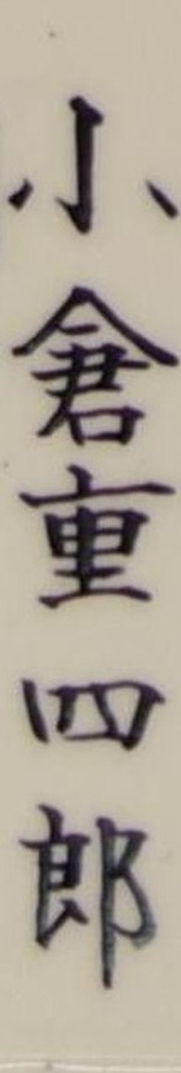小倉重四郎
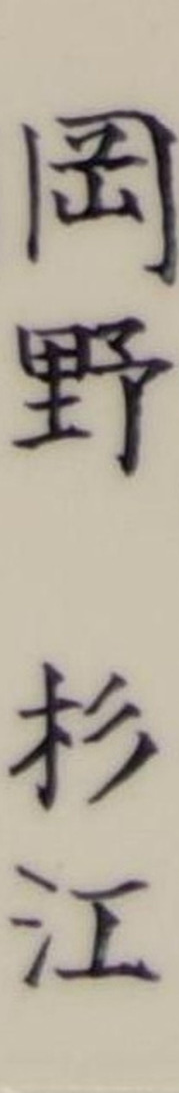岡野杉江
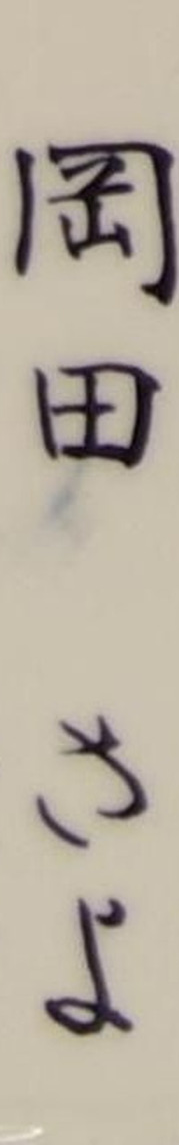岡田さよ
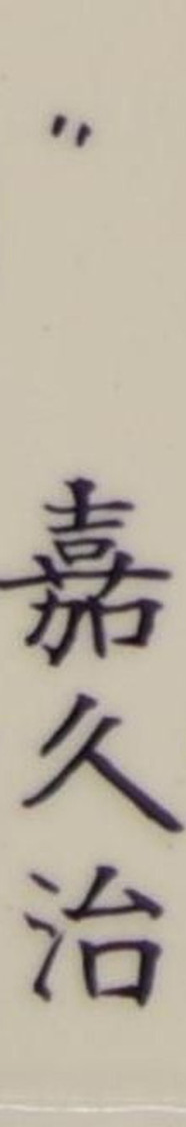嘉久治
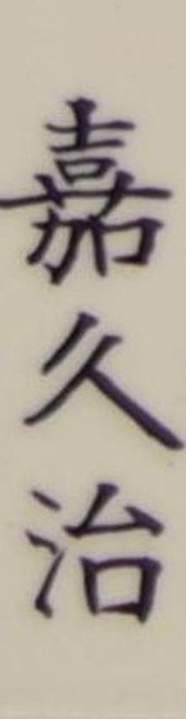嘉久治
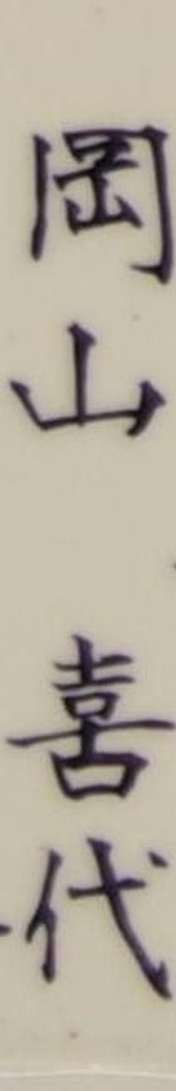岡山喜代
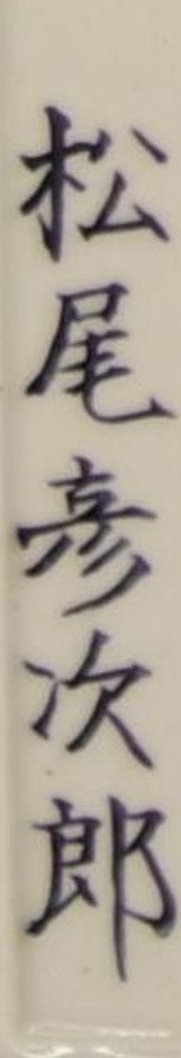松尾彦次郎
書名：E~L
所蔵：高野山金剛峯寺
